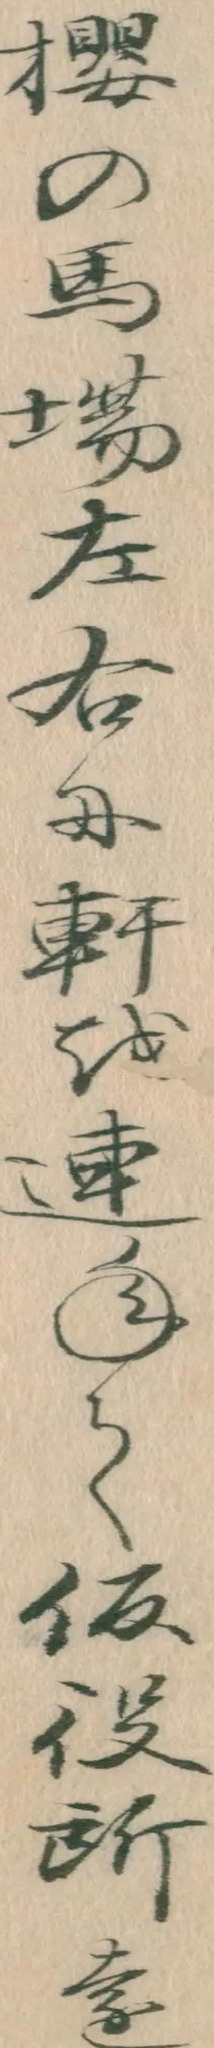桜の馬場左右に軒を連ねて仮役所を
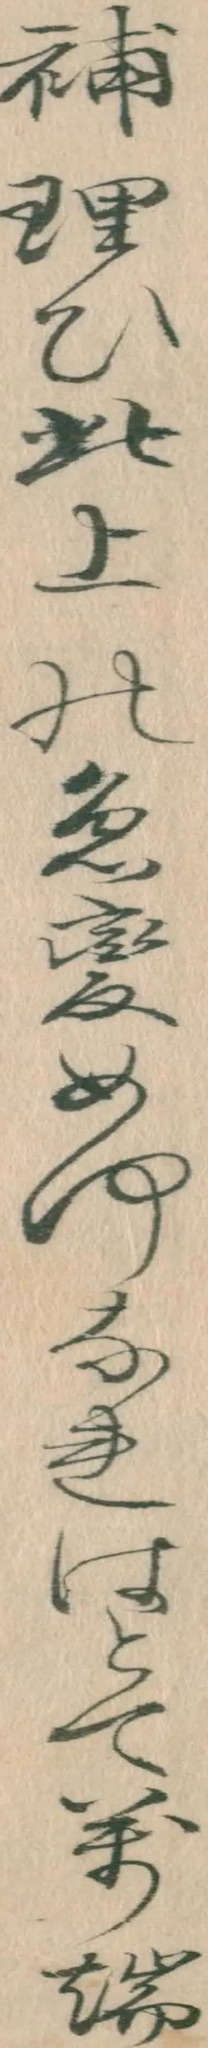補理ひ是上の急変如何なれはとて万端
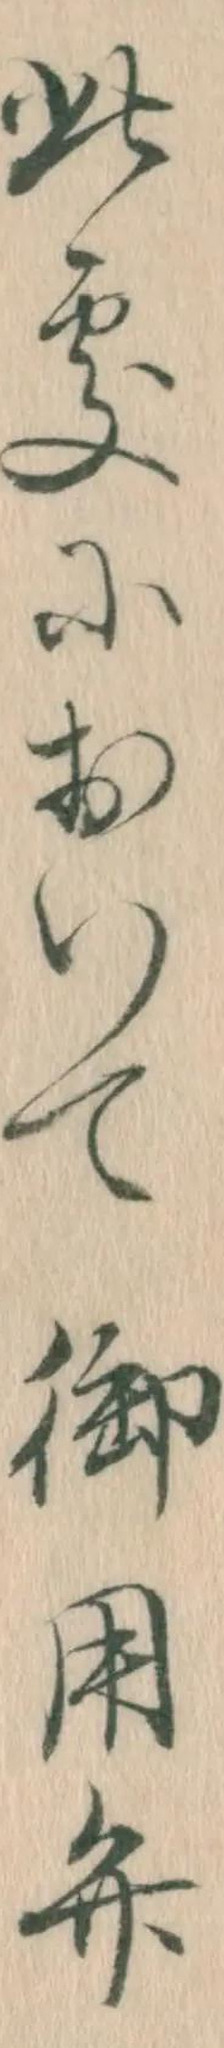此処において御用弁
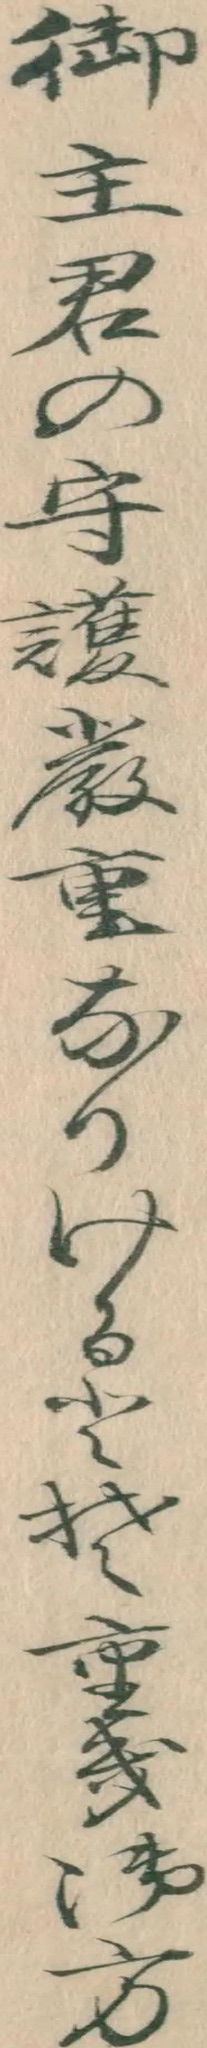御主君の守護厳重なりけるとそ重き御方
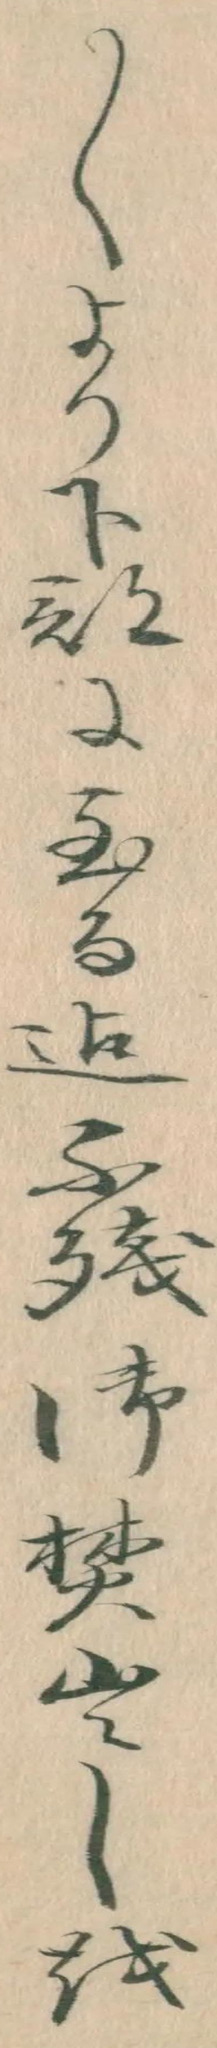〳〵より下部に至る迄不残御焚出しを
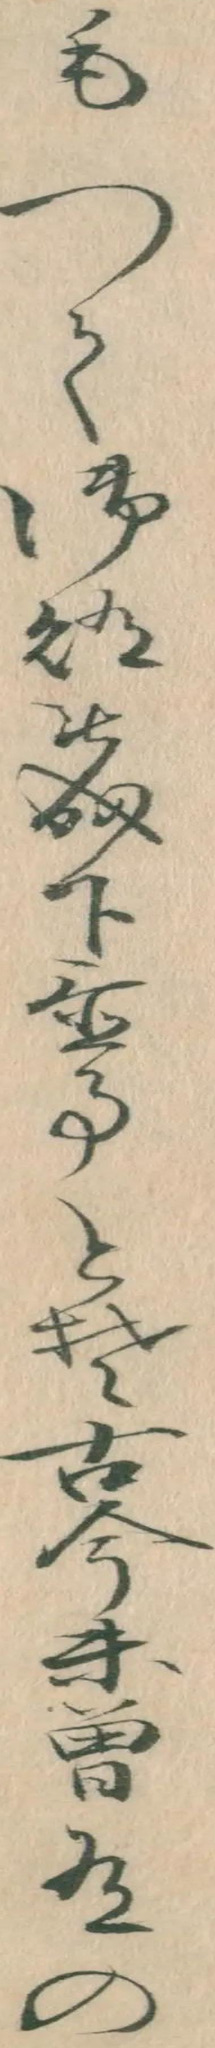もつて御賄被成下置事とそ古今未曾有の

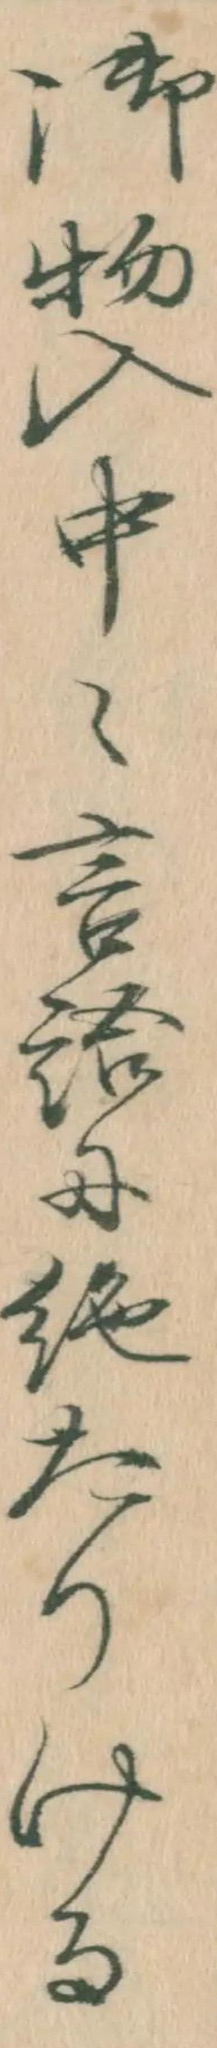御物入中〻言語に絶たりける
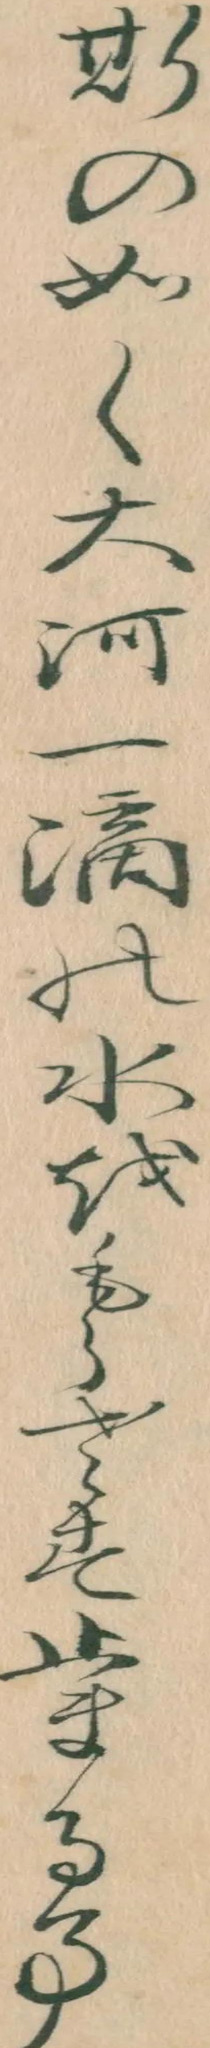斯の如く大河一滴の水をもらさす止まる事
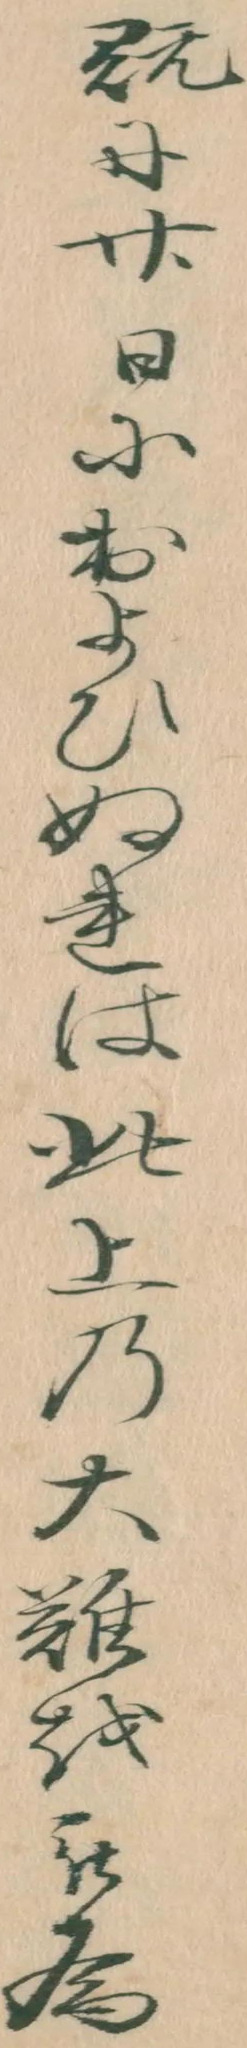既に廿日におよひぬれは此上の大難を被為
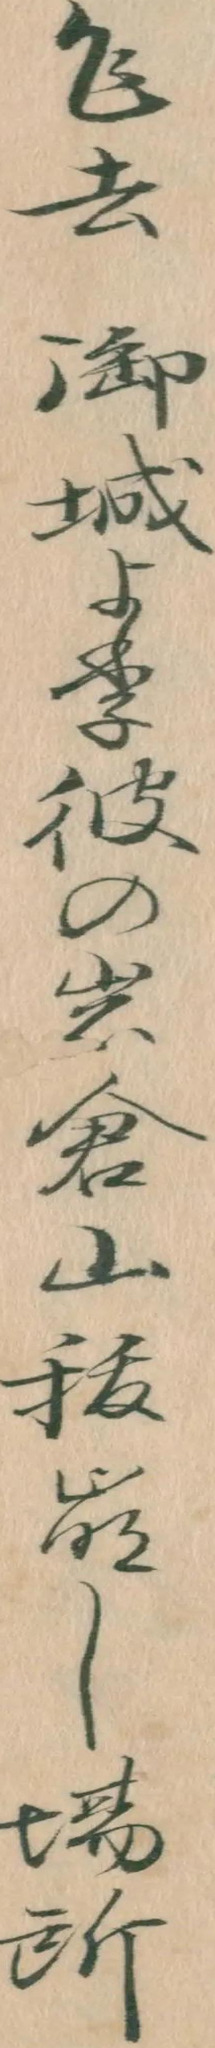乍去御城より彼の岩倉山抜崩し場所
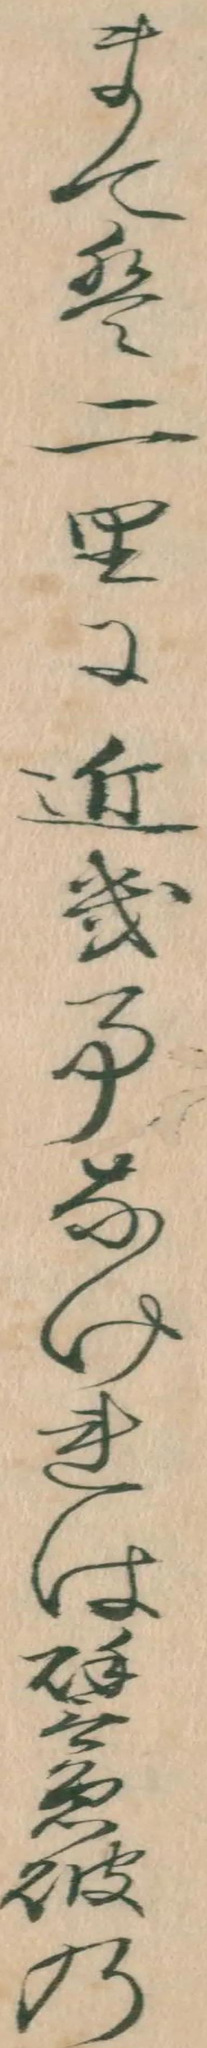まては二里に近き事なけれは譬急破の
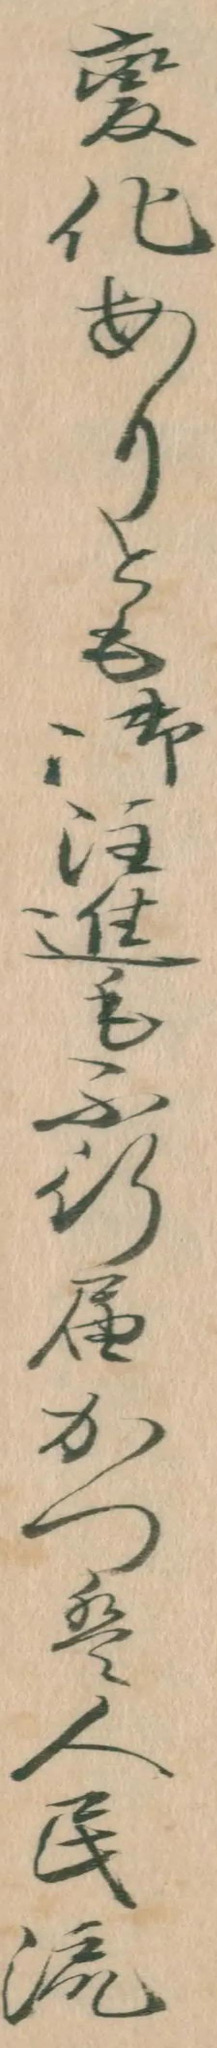変化ありとも御注進も不行届かつは人民流
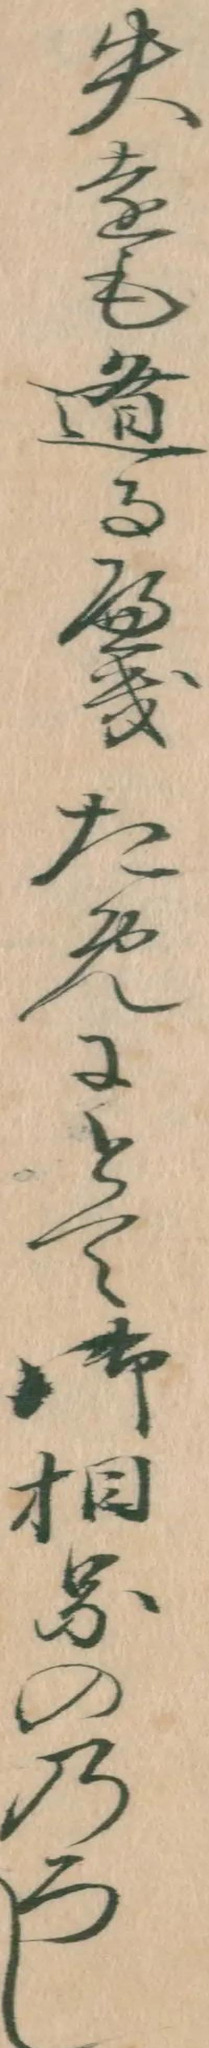失をも遁るへきためにとて御相図ののろし
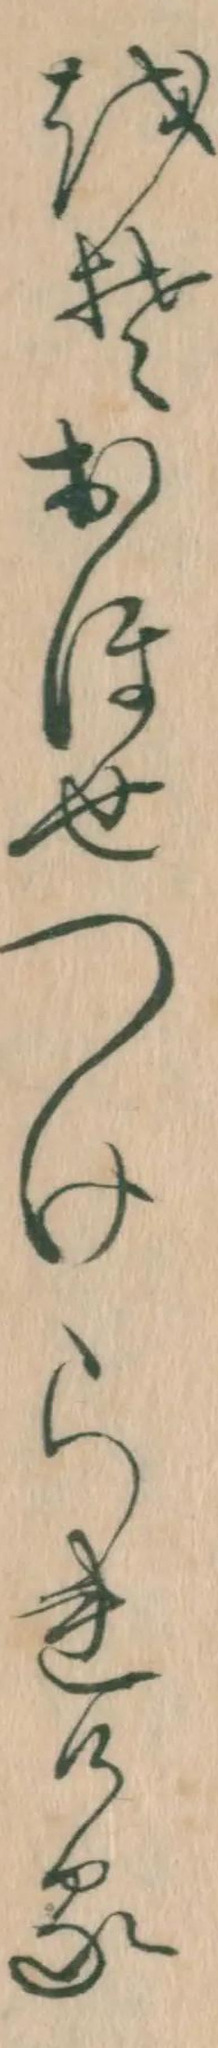をそおほせつけられける
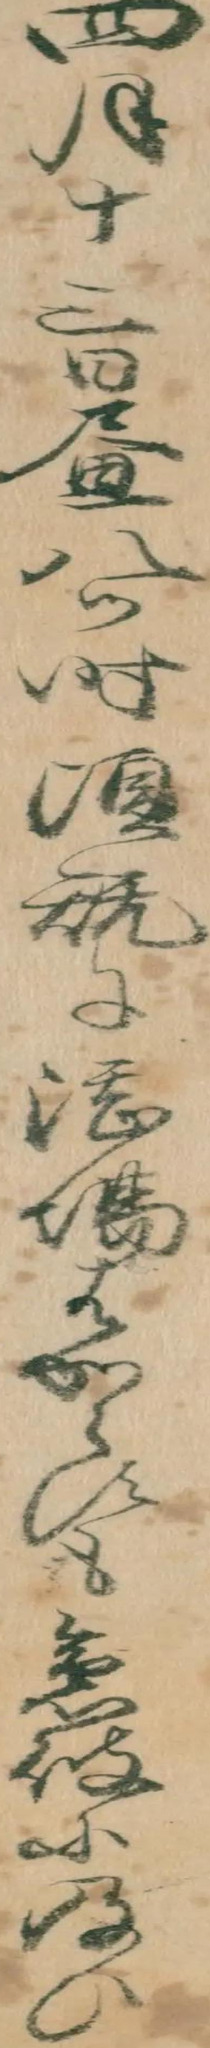四月十三日昼八ツ時頃既に湛場はからすも急破に及ひ
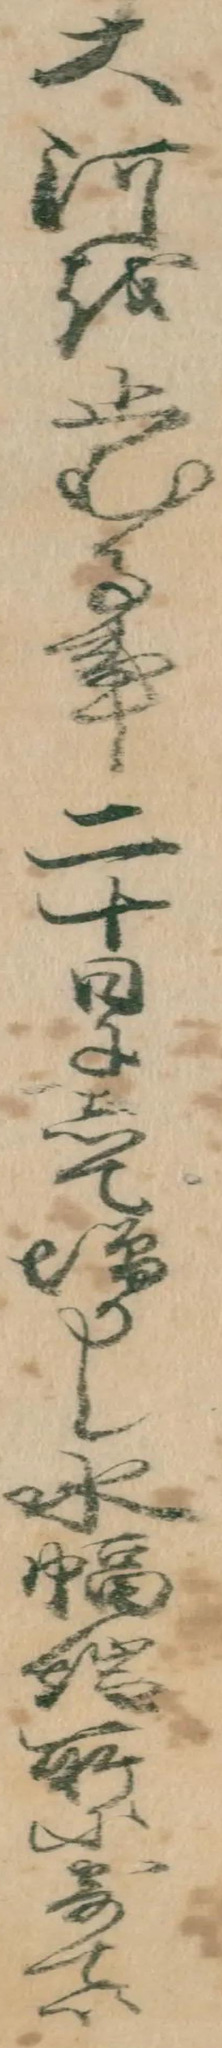大河を止むる事二十日にして増りし水幅端所に寄ては
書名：俗語之種. [6]
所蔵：国立国会図書館 National Diet Library, JAPAN
